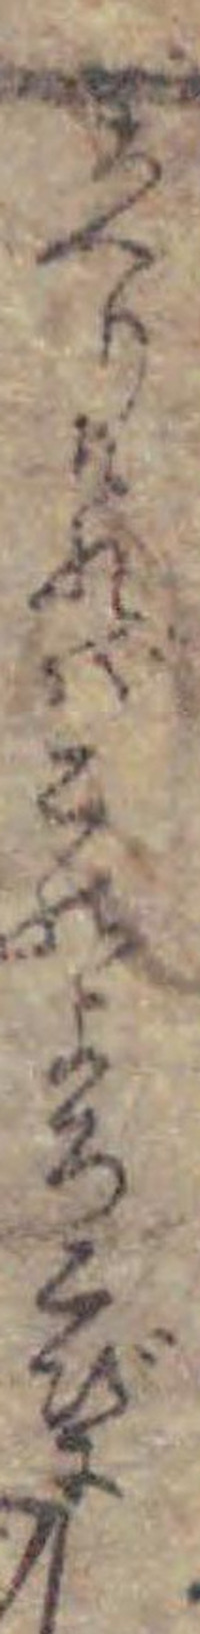かへりければこのよろこびに
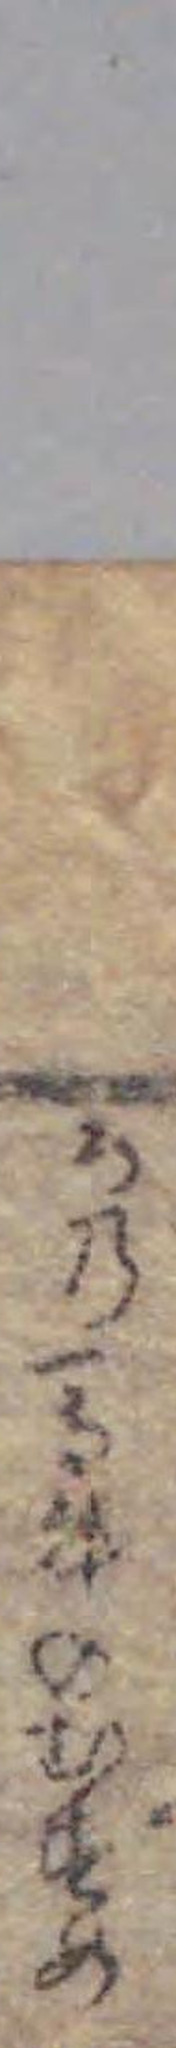かの馬斗のむすめ
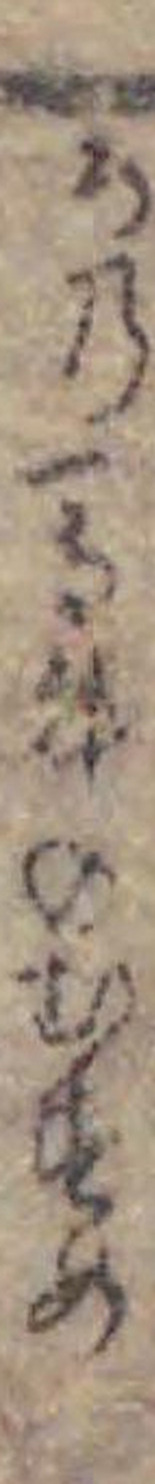かの馬斗のむすめ
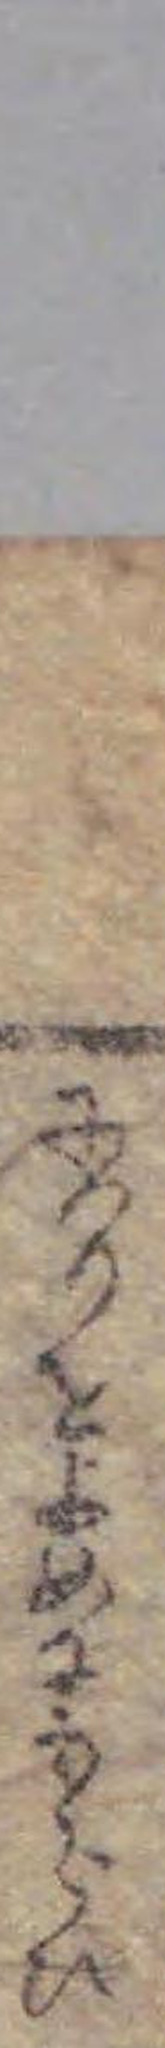にかりをよめにもらひ
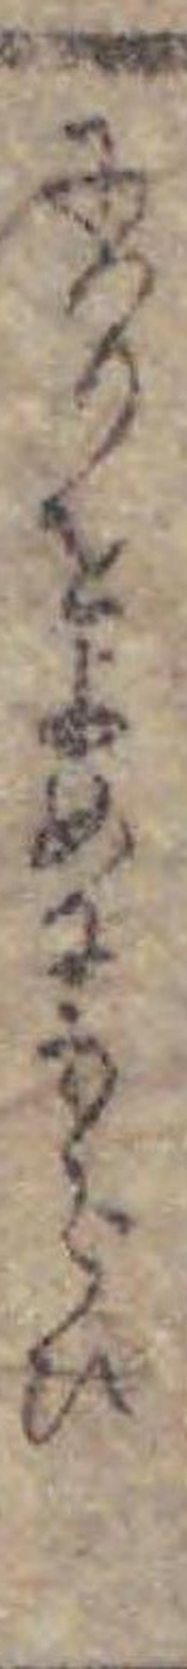にかりをよめにもらひ
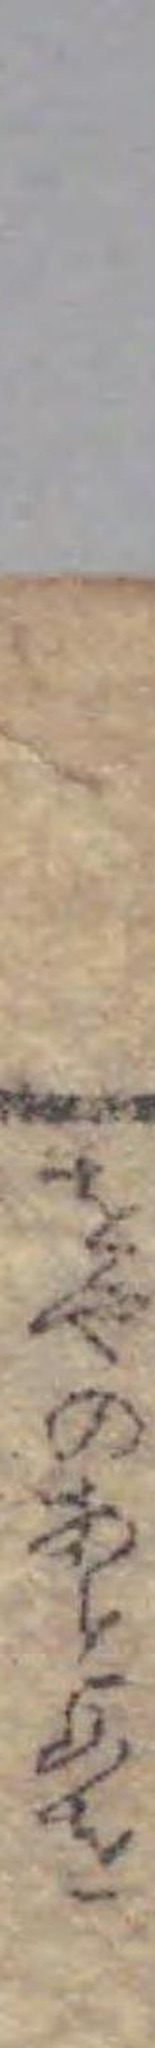おやのあとめを
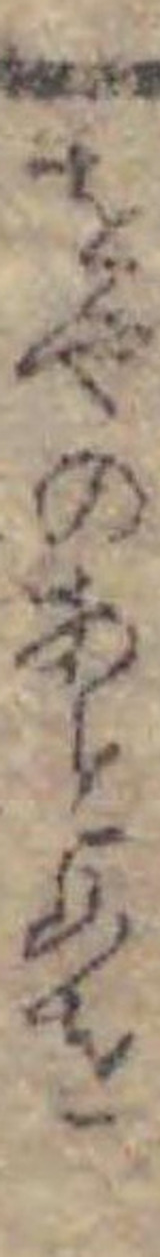おやのあとめを
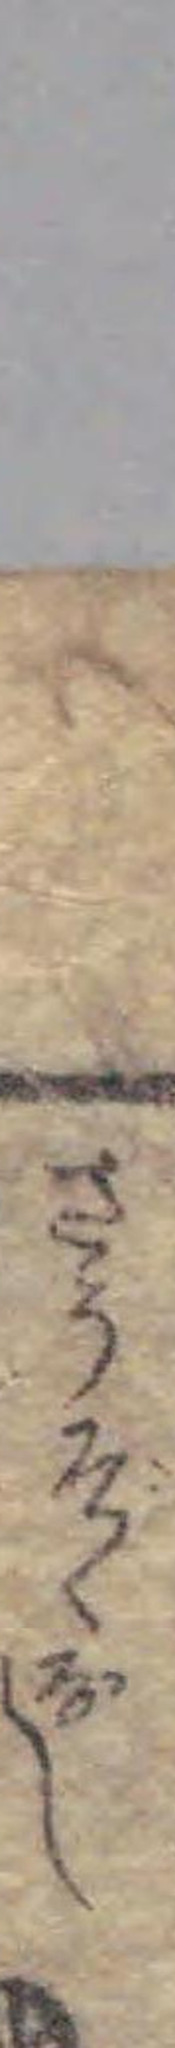さうぞくなし
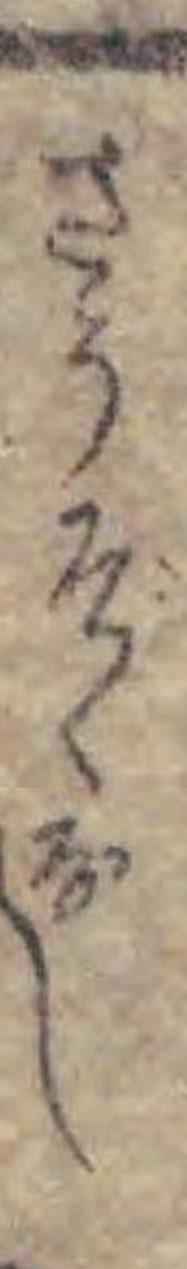さうぞくなし
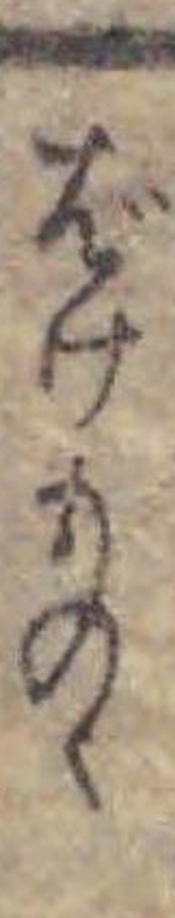ばけものゝ
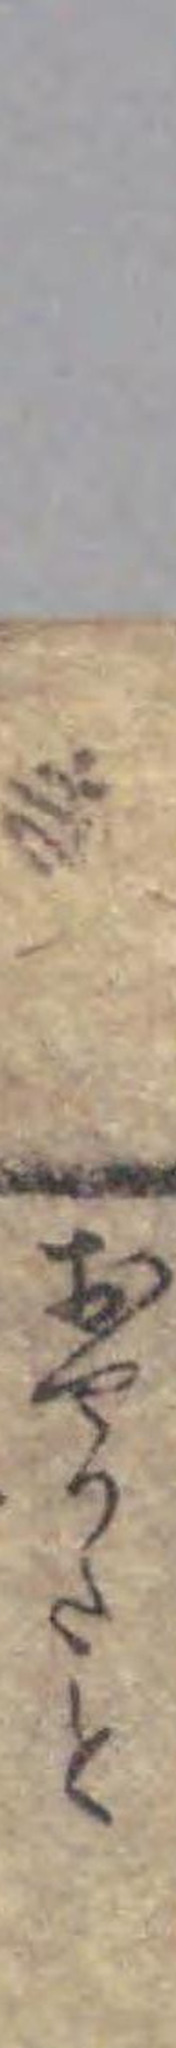おやかたと
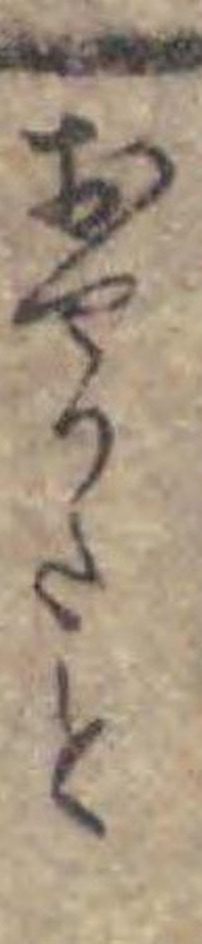おやかたと
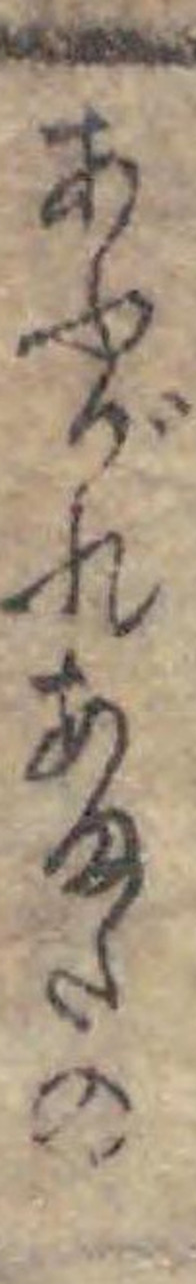あふがれあまたの
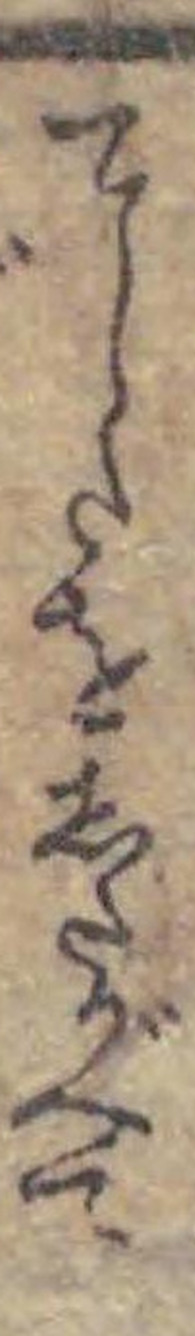てしたをしたがへて
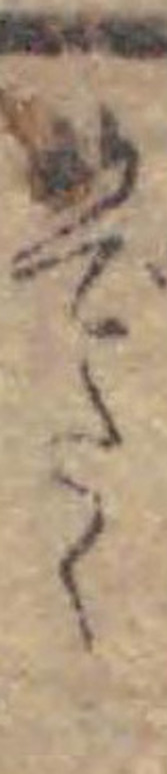めでたく
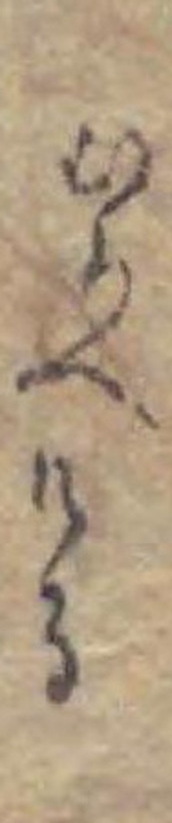むかへける
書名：化物世界夜半嵐 : 3巻
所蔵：国立国会図書館 National Diet Library, JAPAN
